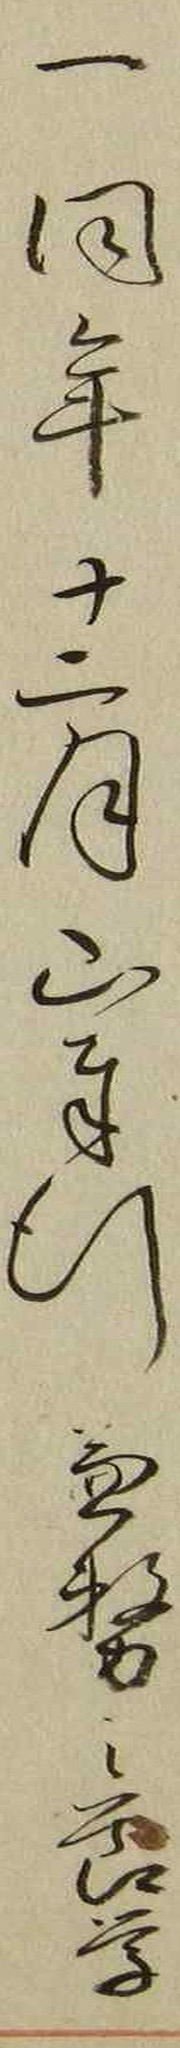一同年十二月山奉行兼務之節学
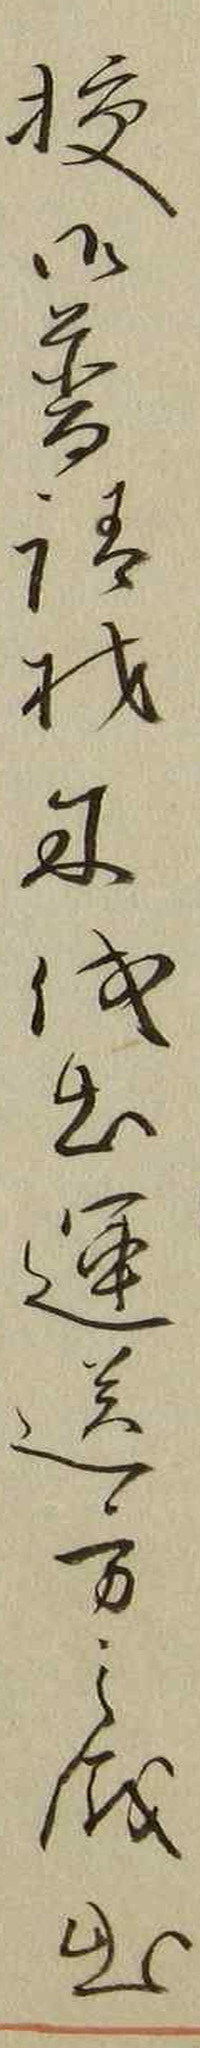校御普請材木伐出運送方之儀出
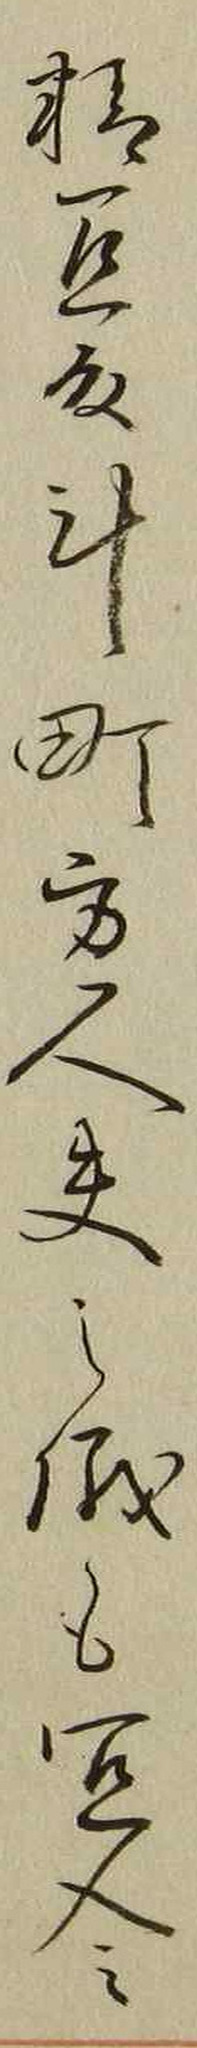精宜取計町方人夫之儀も宜令
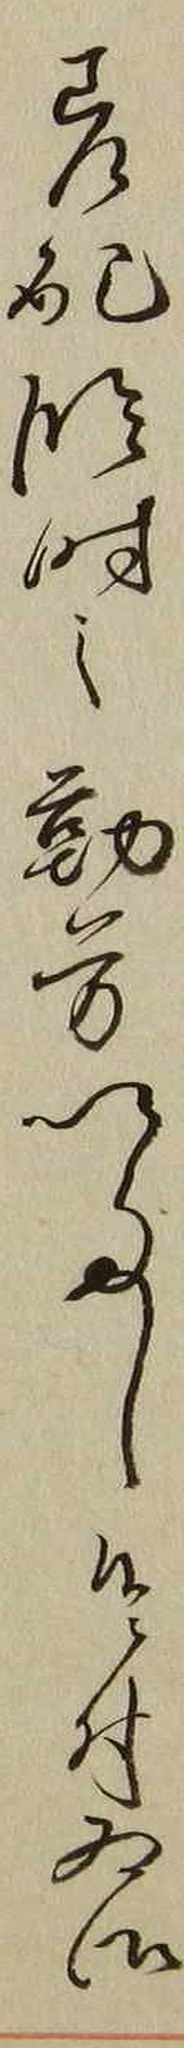差配臨時之勤労いたし候に付為御
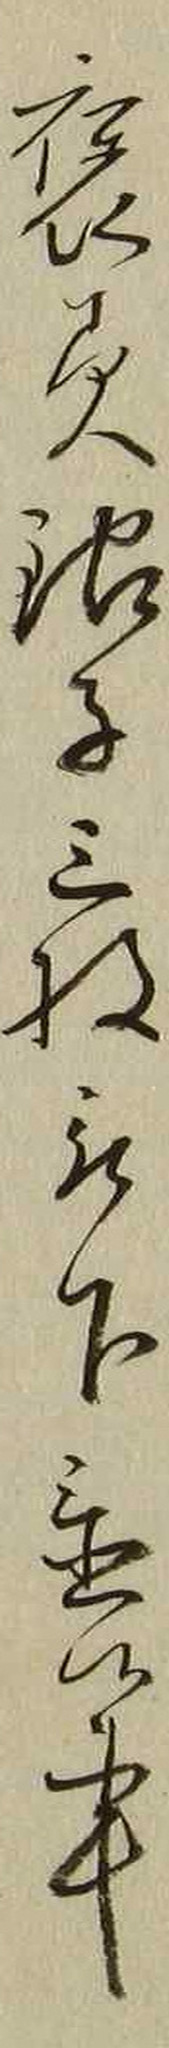褒美銀子三枚被下置候事
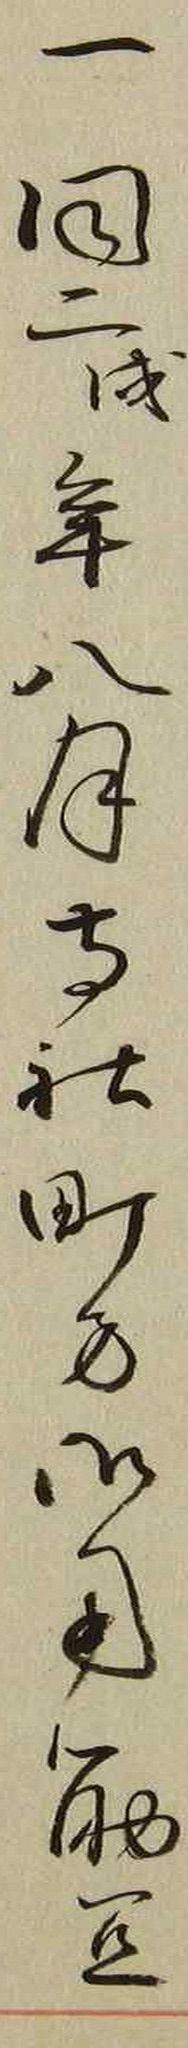一同二戌年八月寺社町方御用筋宜
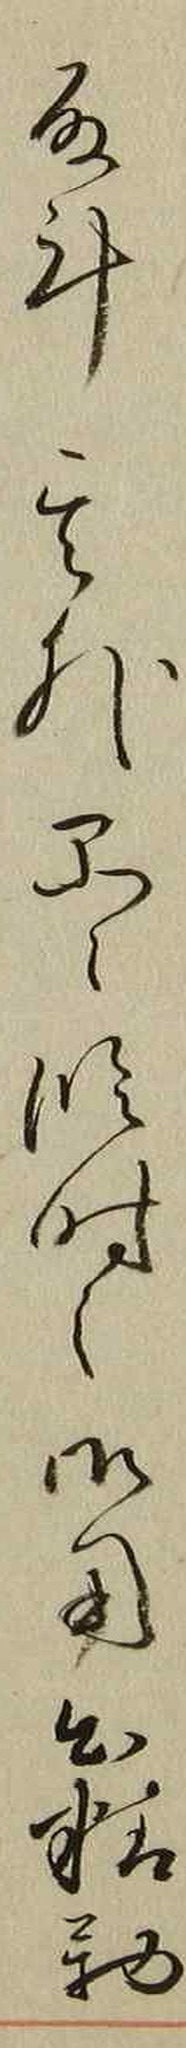取計其外品々臨時之御用出精勤
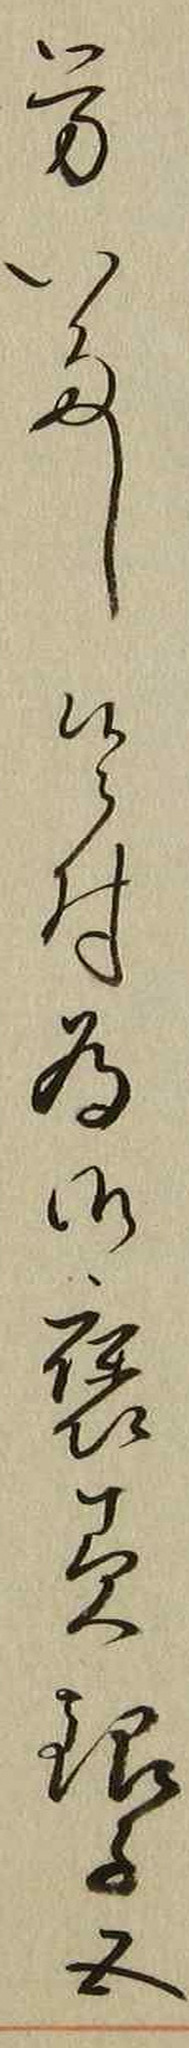労いたし候に付為御褒美銀子五
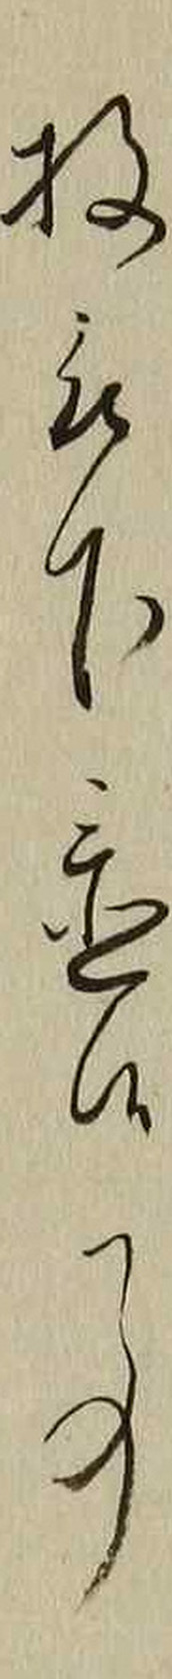枚被下置候事
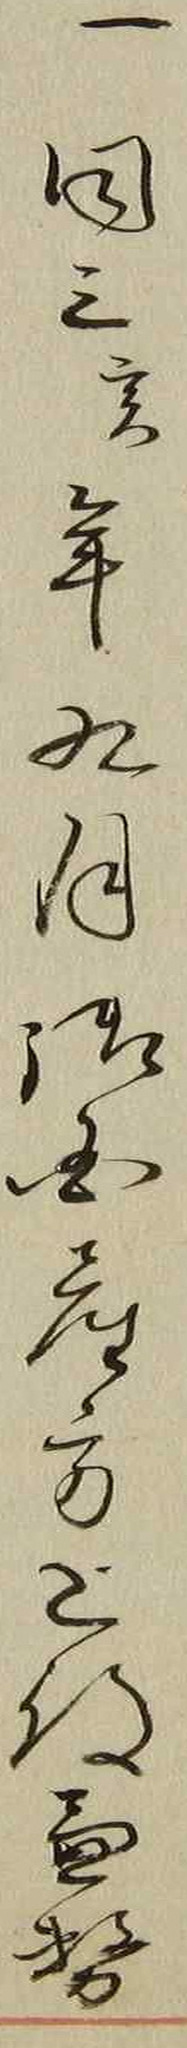一同三亥年九月御国産方上役兼務
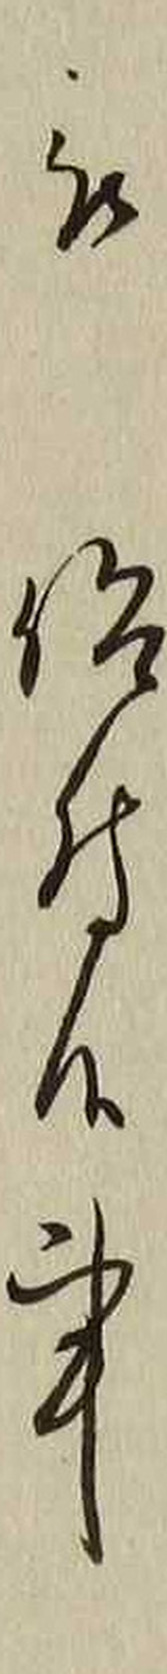被仰付候事
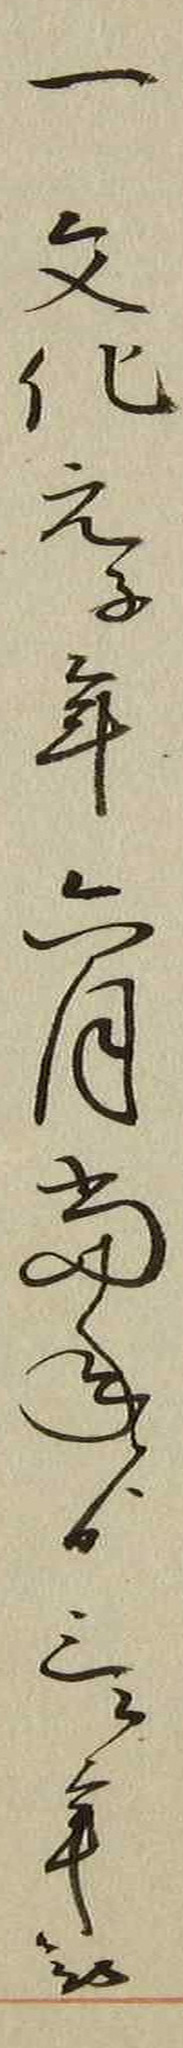一文化元子年六月当年ゟ三ケ年被
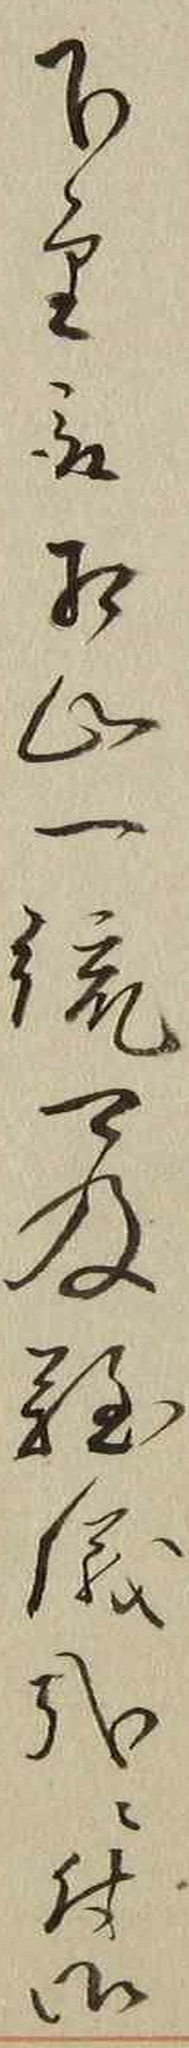下金被相止一統可及難儀哉に付御
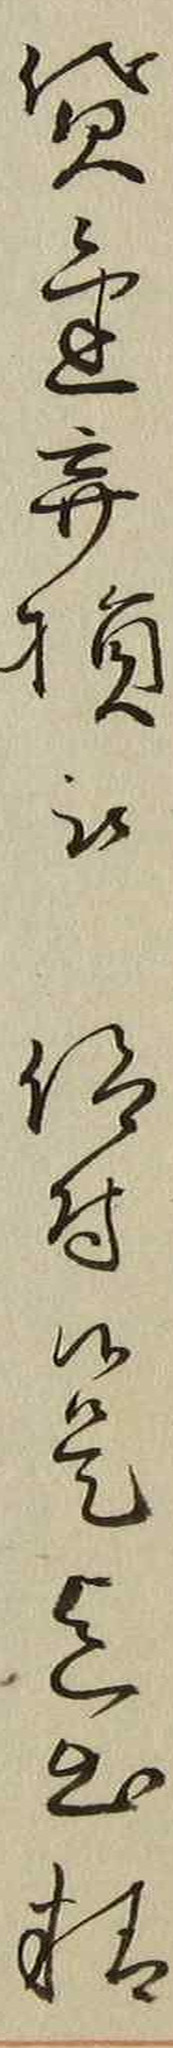貸金弃損被仰付候是迄出精
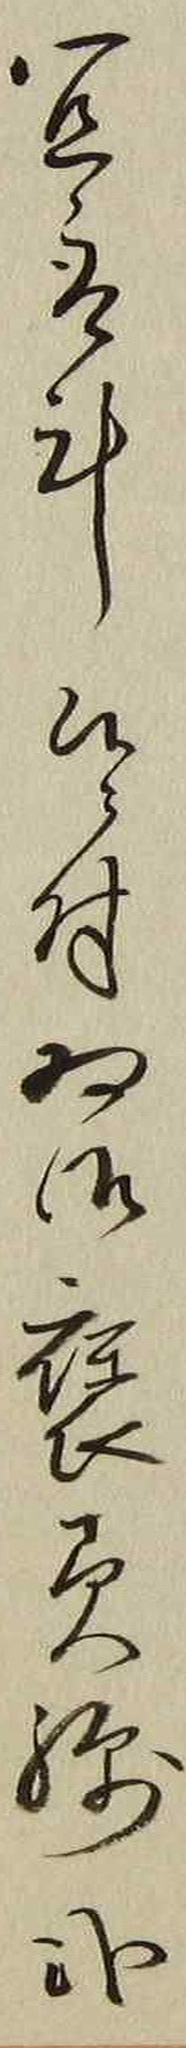宜取計候に付為御褒美綿弐
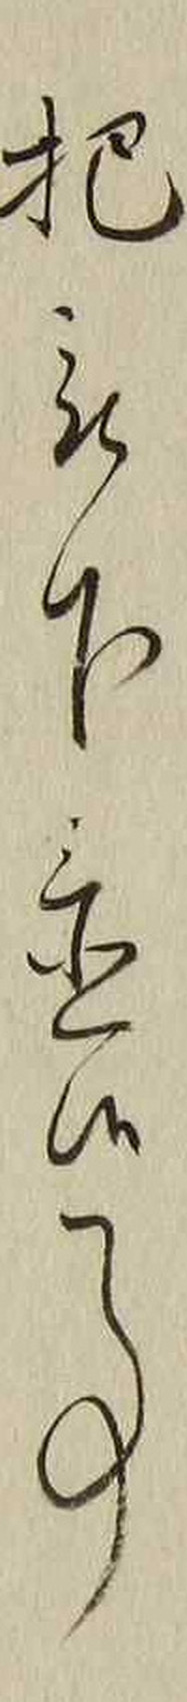把被下置候事
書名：諸士系譜　巻之3　い之部3
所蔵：会津若松市立会津図書館
